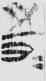之日
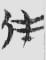伅
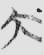大
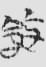○（令）
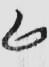㠯（以）
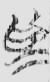爲
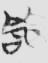○（令）
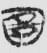圍
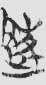{阩止}
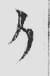人
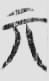亓（其）
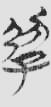○（弱）
